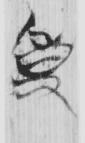事
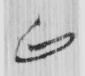㠯（以）
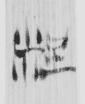{米呈}
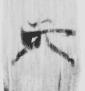亓
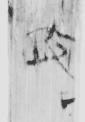攻
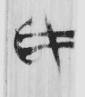女
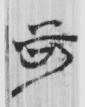可
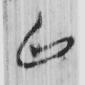㠯（以）
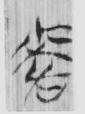差
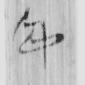身
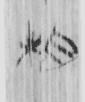相
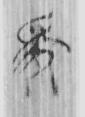{爪家}
